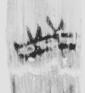戔
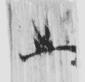之
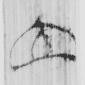立
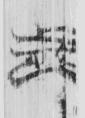者
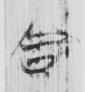同
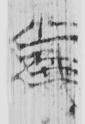雀
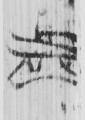者
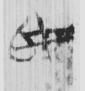母
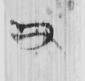又
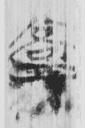{网疋}
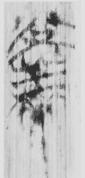{网束束}
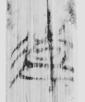遠
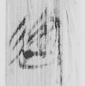逐
